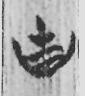由
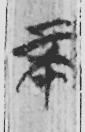不
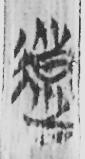邋
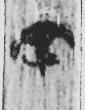丁
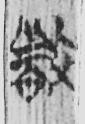敬
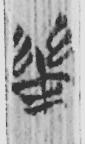𪪋（哉）
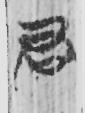君
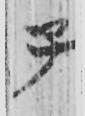子
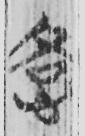恪
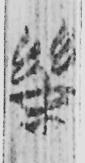𪪋（哉）
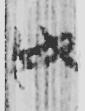母
